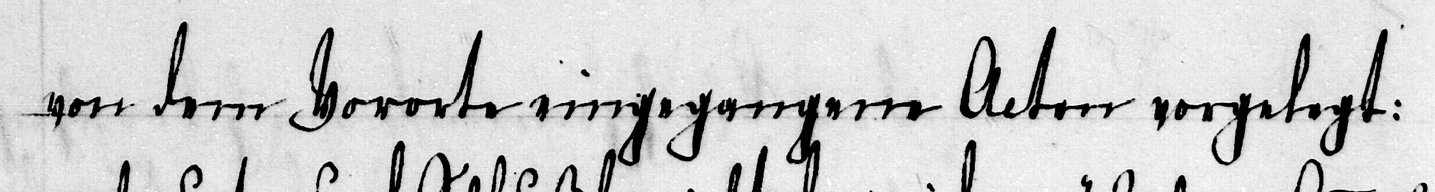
von dem Vororte eingegangene Acten vorgelegt:
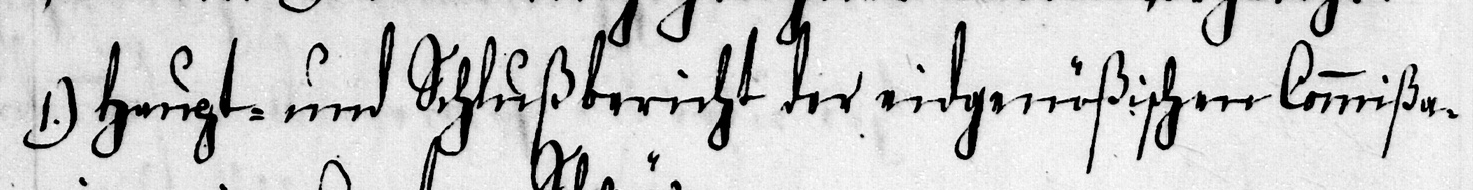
1.) Haupt- und Schlußbericht der eidgenößischen Commißa¬
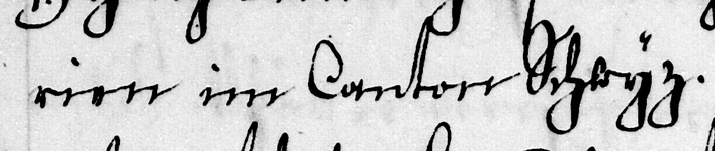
rien im Canton Schwyz.
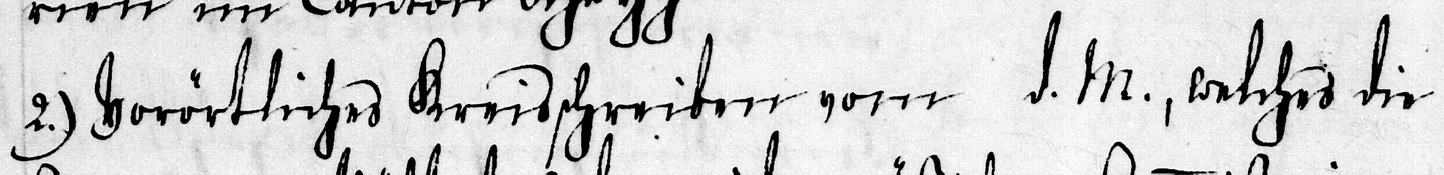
2.) Vorörtliches Kreisschreiben vom [...] d. M., welches die
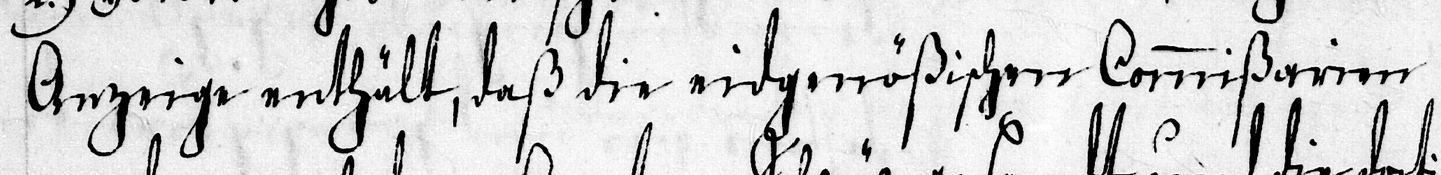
Anzeige enthält, daß die eidgenößischen Commißarien
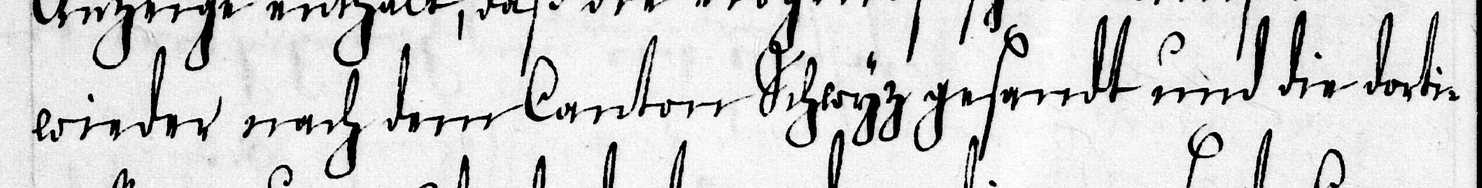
wieder nach dem Canton Schwyz gesandt und die dort¬
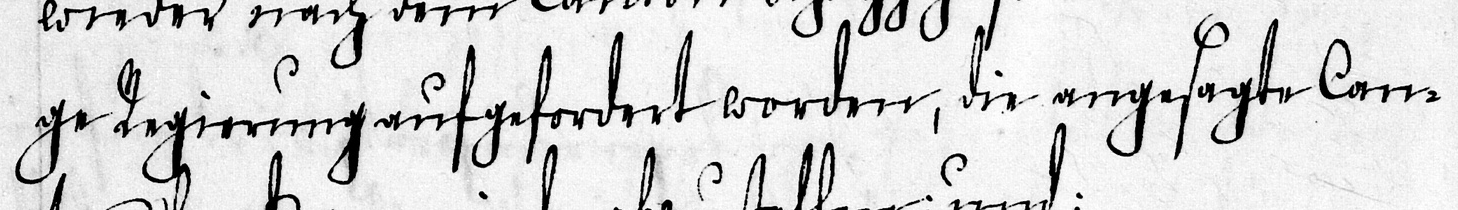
ige Regierung aufgefordert worden, die angesagte Can¬
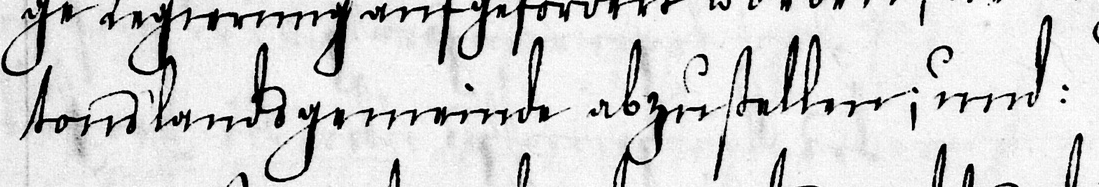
tonslandsgemeinde abzustellen; und:
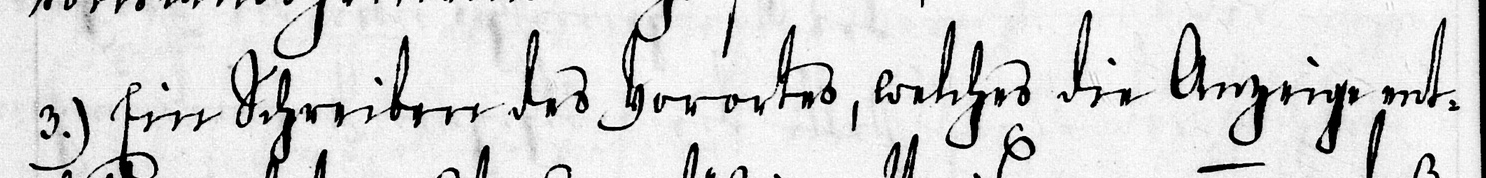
3.) Ein Schreiben des Vorortes, welches die Anzeige ent¬
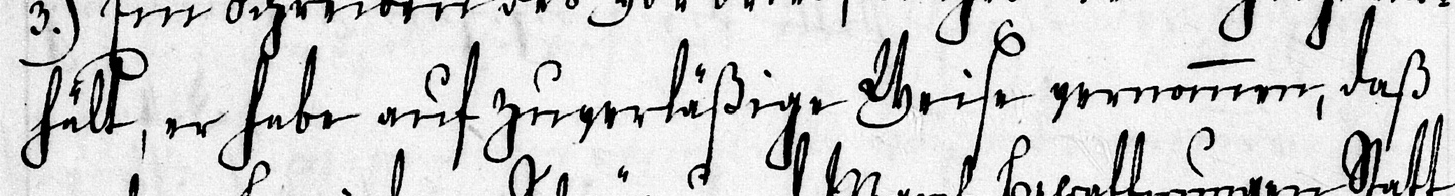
hält, er habe auf zuverläßige Weise vernommen, daß
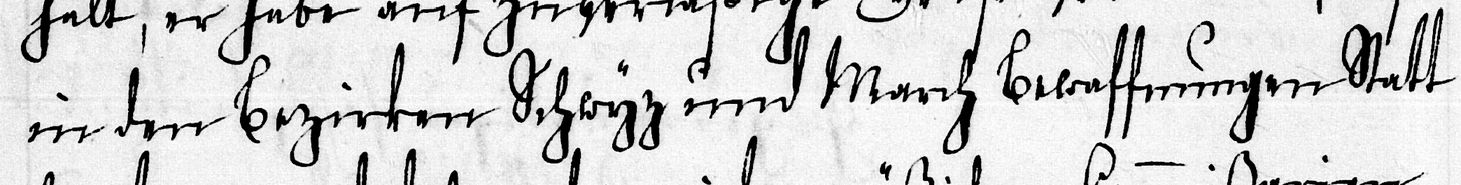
in den Bezirken Schwyz und March Bewaffnungen Statt
